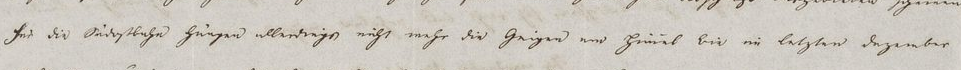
Für die Südostbahn hängen allerdings nicht mehr die Geigen im Himmel wie im letzten Dezember
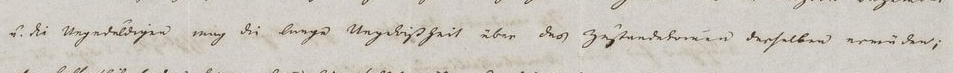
u. die Ungeduldigen mag die lange Ungewißheit über das Zustandekommen derselben ermüden;
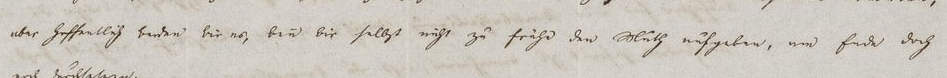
aber hoffentlich werden wir es, wenn wir selbst nicht zu frühe den Muth aufgeben, am Ende doch
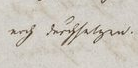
noch durchsetzen.
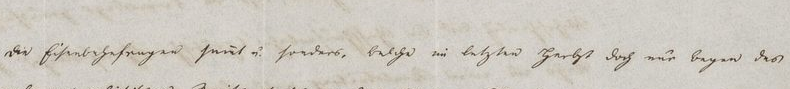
Die Eisenbahnfragen sammt u. sonders, welche im letzten Herbst doch nur wegen des
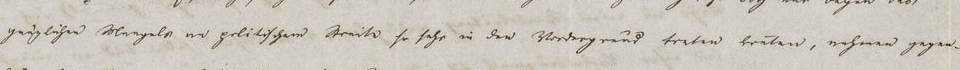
gänzlichen Mangels an politischem Streite so sehr in den Vordergrund treten konnten, nehmen gegen-
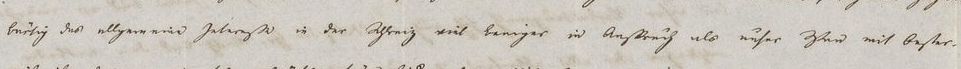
wärtig das allgemeine Intereße in der Schweiz viel weniger in Anspruch als unser Span mit Oester-
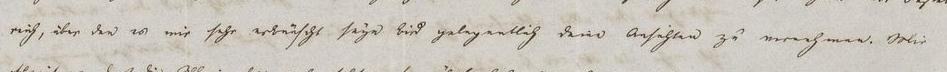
reich, über den es mir sehr erwünscht seyn wird gelegentlich Deine Ansichten zu vernehmen. Mir
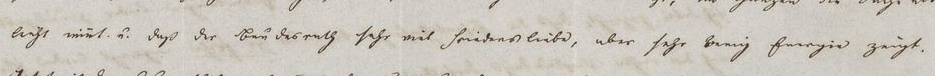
leicht nimmt u. daß der Bundesrath sehr viel Friedensliebe, aber sehr wenig Energie zeigt.
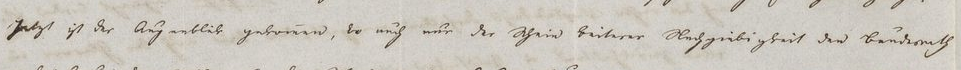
Jetzt ist der Augenblick gekommen, wo auch nur der Schein weiterer Nachgiebigkeit den Bundesrath
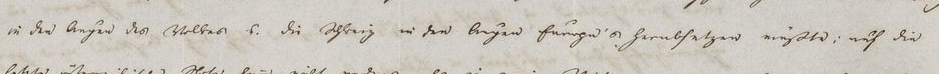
in den Augen des Volkes u. die Schweiz in den Augen Europa's herabsetzen müßte; auf die
